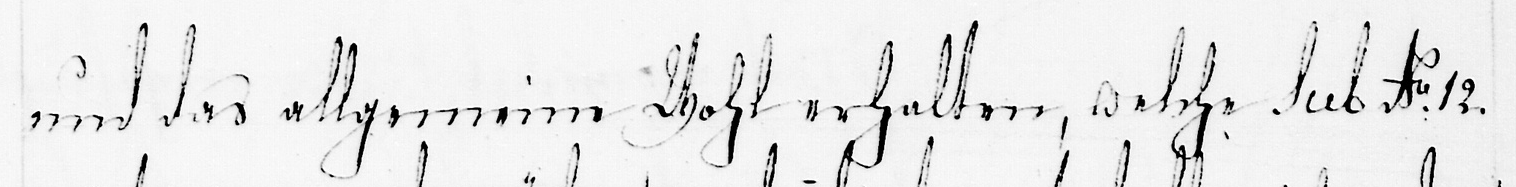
und das allgemeine Wohl erhalten, welche sub No.
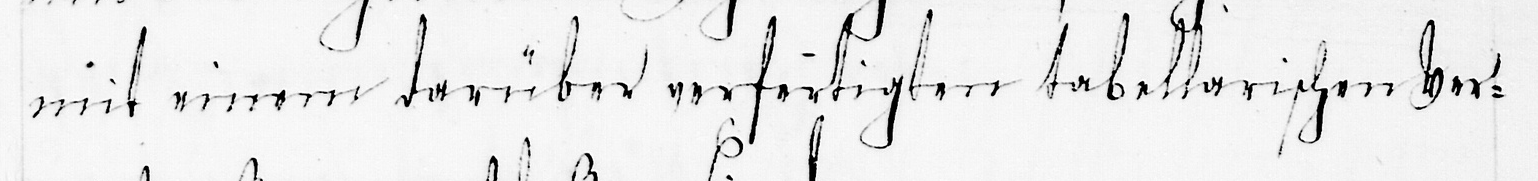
mit einem darüber verfertigten tabellarischen Ver¬
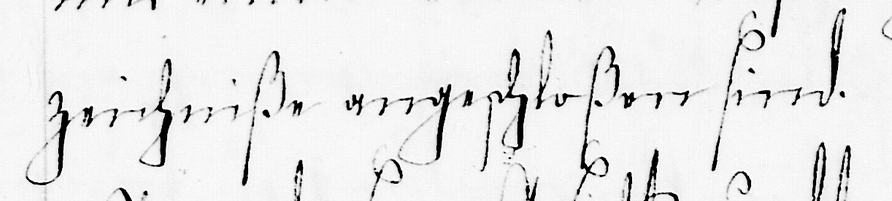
zeichniße angeschloßen sind.
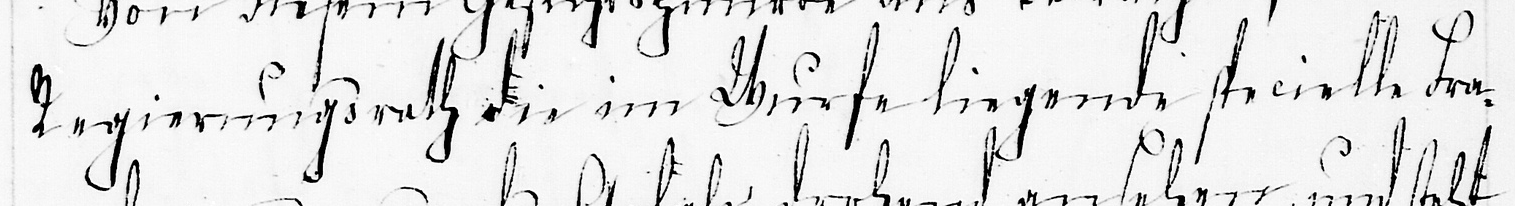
Regierungsrath die im Wurfe liegende specielle Fr¬
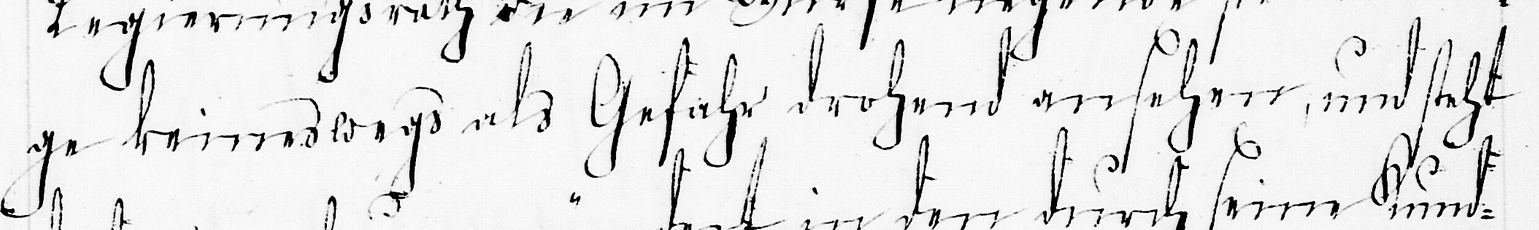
age keineswegs als Gefahr drohend ansehen, und steht
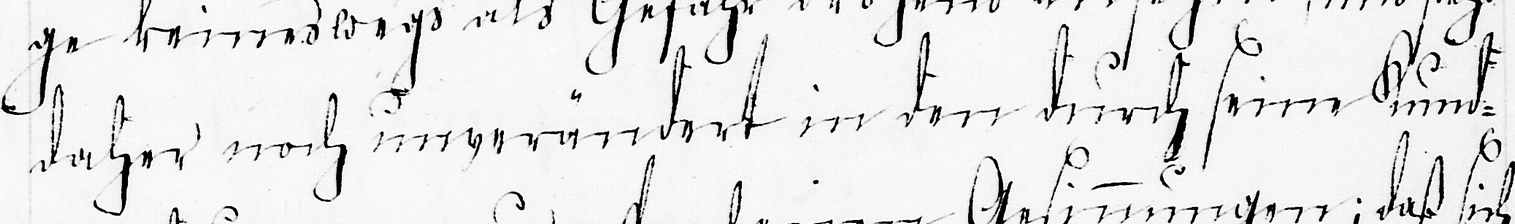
daher noch unverändert in den durch seine Kund¬
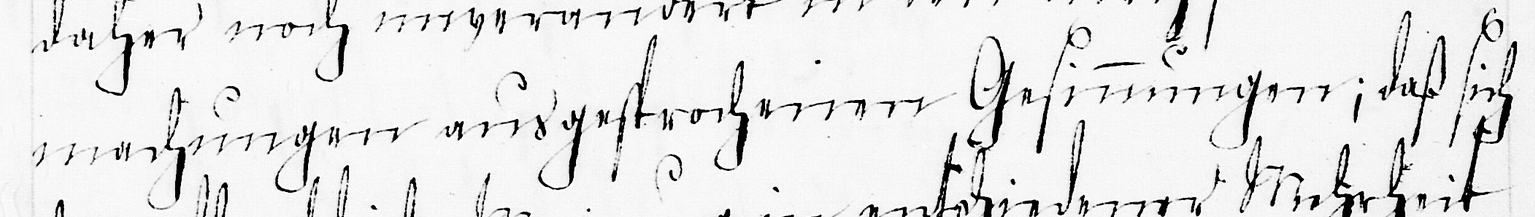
machungen ausgesprochenen Gesinnungen, daß sich
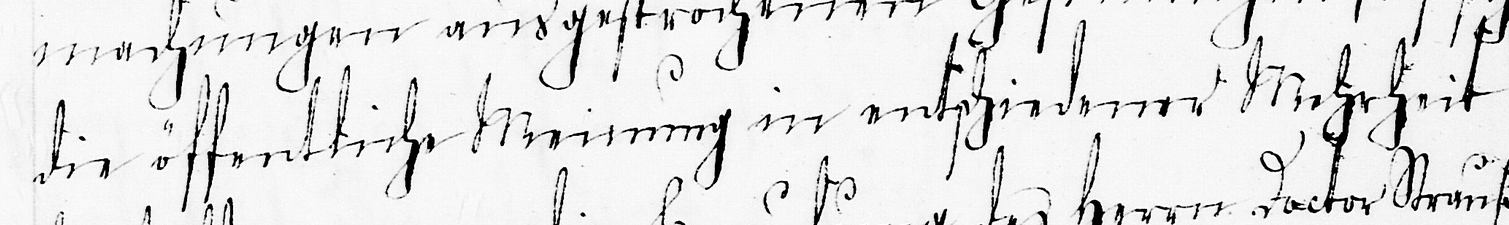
die öffentliche Meinung in entschiedener Mehrheit
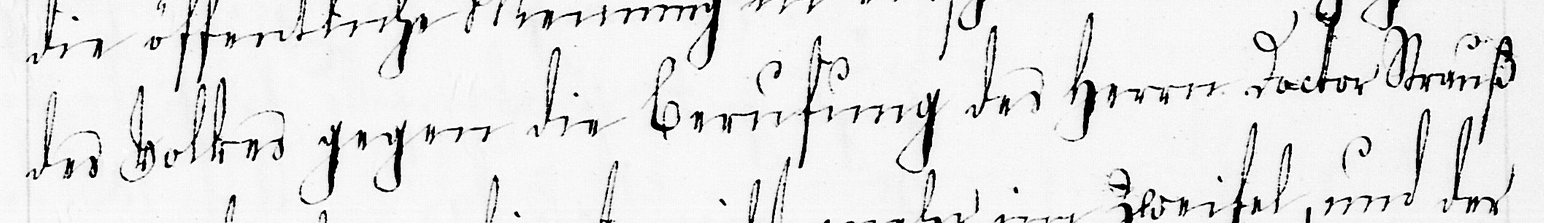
des Volkes gegen die Berufung des Herrn Doctor Strauß
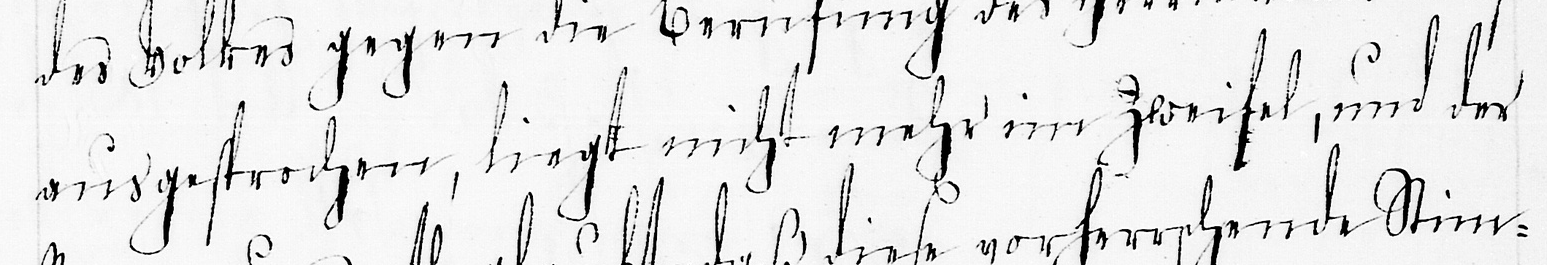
ausgesprochen, liegt nicht mehr im Zweifel, und der
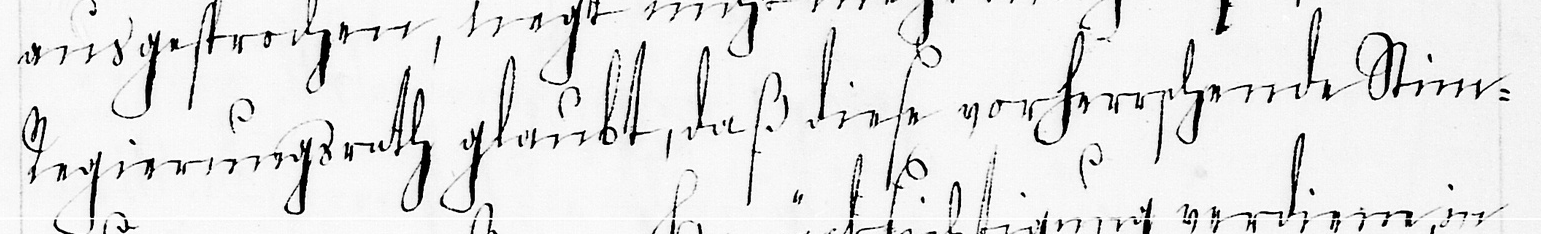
Regierungsrath glaubt, daß diese vorherrschende Stim¬
